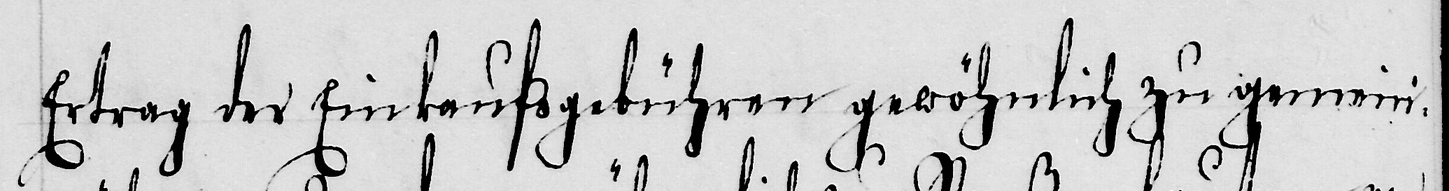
Ertrag der Einkaufsgebühren gewöhnlich zu gemein¬
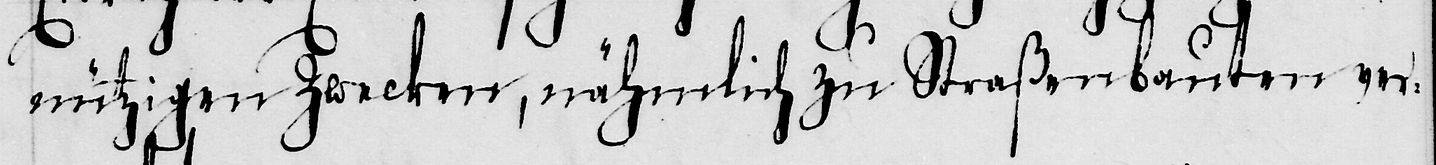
nützigen Zwecken, nähmlich zu Straßenbauten ver¬
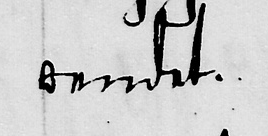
wendet.
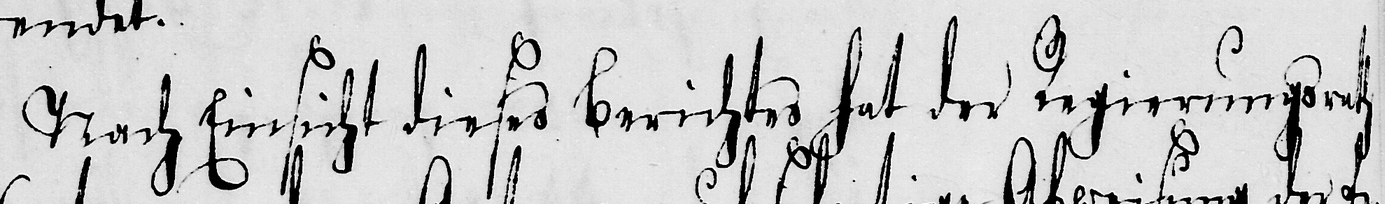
Nach Einsicht dieses Berichtes hat der Regierungsr¬
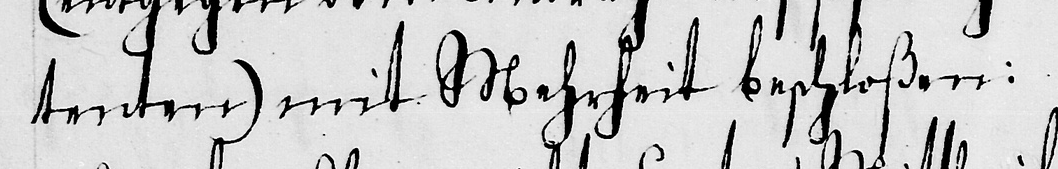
etenten) mit Mehrheit beschloßen:
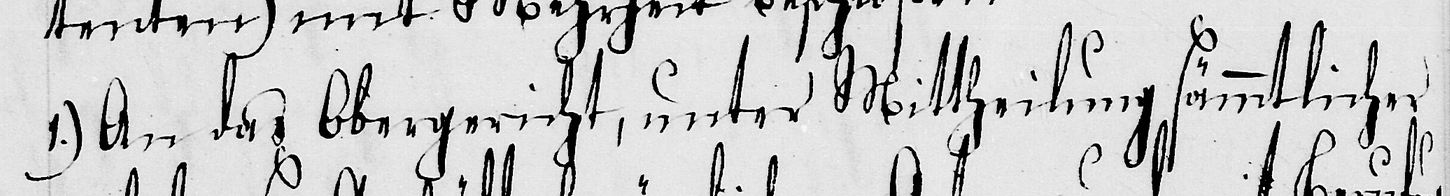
1.) An das Obergericht, unter Mittheilung sämmtlicher
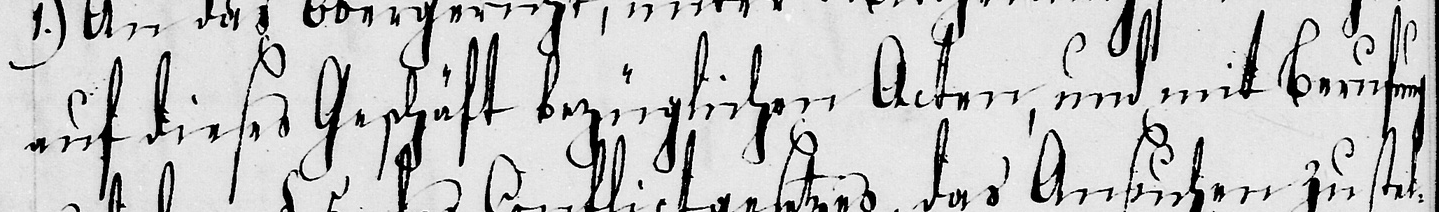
auf dieses Geschäft bezüglichen Acten, und mit Beruf¬
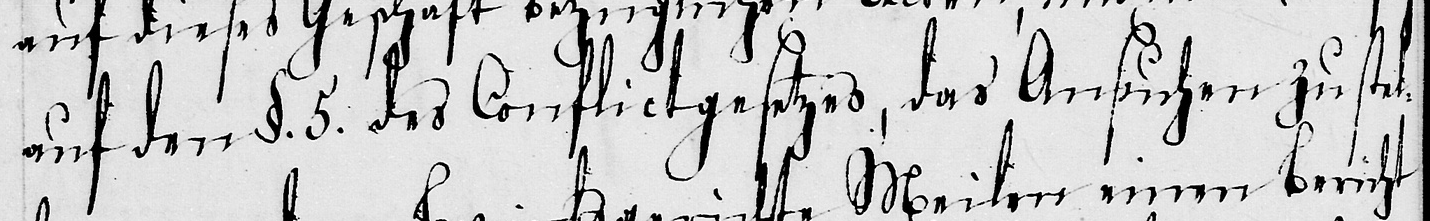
auf den §. 5. des Conflictgesetzes, das Ansuchen zu st¬
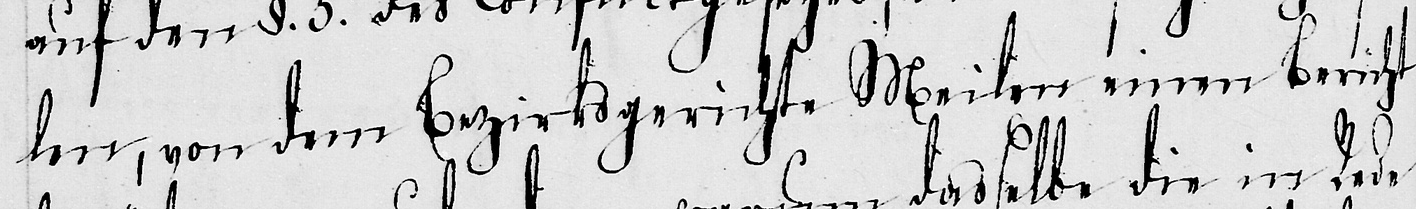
len, von dem Bezirksgerichte Meilen einen Bericht
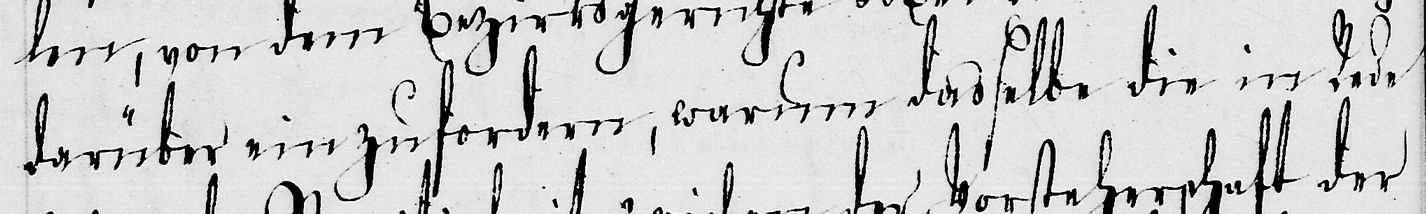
darüber einzufordern, warum dasselbe die in Rede
